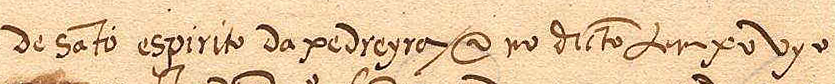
de Sāto espirito da pedreyra / e no dicto tempo vyo
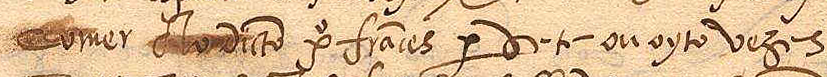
Comer Ao dicto po frāces ꝑ sete ou oyto vezes
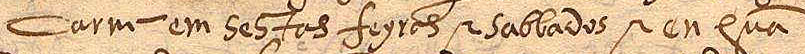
Carne em sestas feyras e sabbados e en hūa
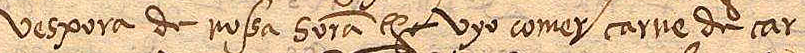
vespora de nossa Sōra lhe vyo comer carne de car
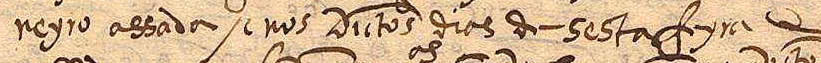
neyro assada / e nos dictos dias de sesta feyra e
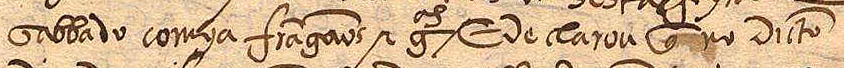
sabbado comya frāgãos e gas / E declarou q̄ no dicto
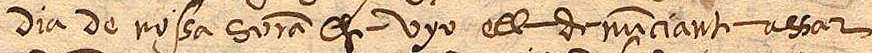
dia de nossa Sōra lhe vyo elle denūciante assar
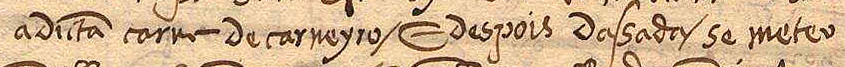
a dicta carne de carneyro / E despois dassada / se meteo
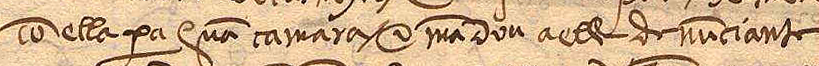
c̄o ella ꝑa hūa camara / e mādou a elle den̄uciante
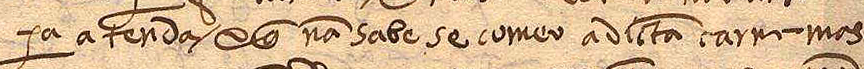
ꝑa a tenda / e q̄ n̄a sabe se comeo a dicta carne mas
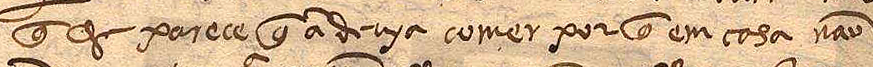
q̄ lhe parece q̄ a deuya comer porq̄ em casa não
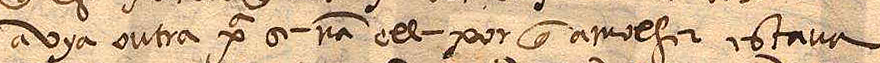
avya outra pa sen̄a elle porq̄ a molher estaua
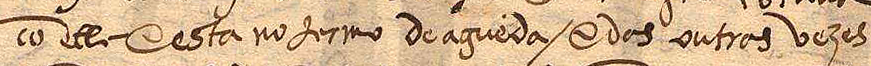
c̄o elle e esta no termo de agueda / e das outras vezes
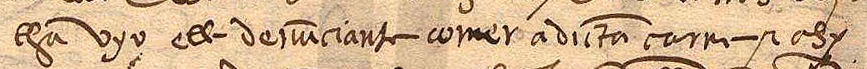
lha vyo elle den̄uciante comer a dicta carne e asy
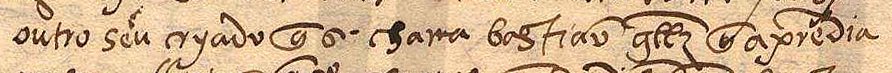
outro seu cryado q̄ se chama bastiaõ ḡllz q̄ aprēdia
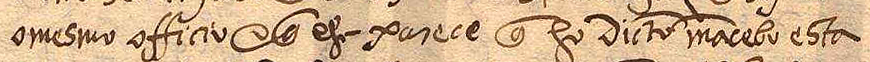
o mesmo officio e q̄ lhe parece q̄ ho dicto m̄acebo esta
